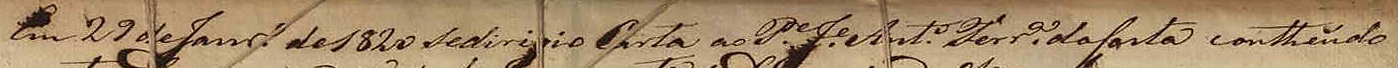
Em 29 de Janr.o de 1820 se dirigio Carta ao P.e J.e Ant.o Ferr.a da Costa contheudo
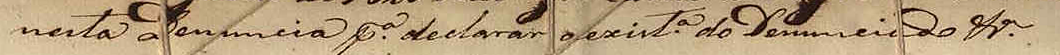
nesta Denuncia p.a declarar a exist.a do Denunciado &r.a
